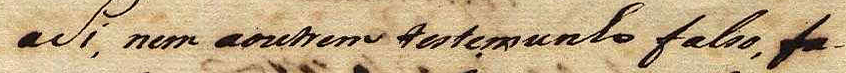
a Si, nem a outrem testemunho falso, fa
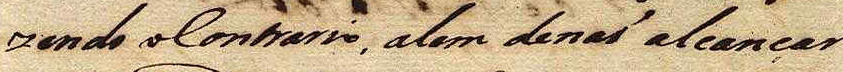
zendo o Contrario, alem de naõ alcançar
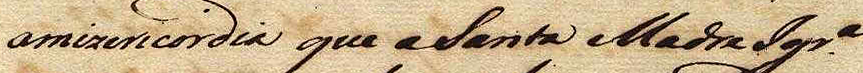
a mizericordia que a Santa Madre Igr.a
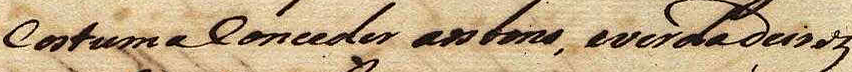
Costuma Conceder aos bons, e verdadeiroz
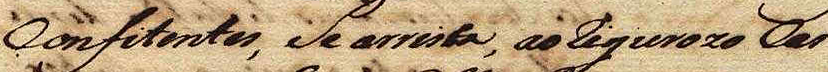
Confitentes, Se arrisca, ao Rigurozo Cas
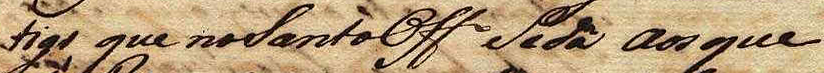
tigo que no Santo Offo Se dá aos que
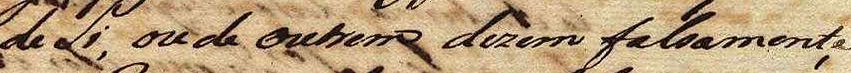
de Si, ou de outrem dizem falsamente,
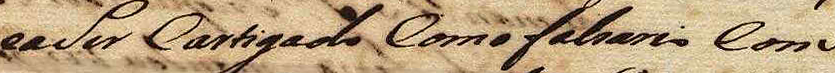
e a Ser Castigado Como falsario Com
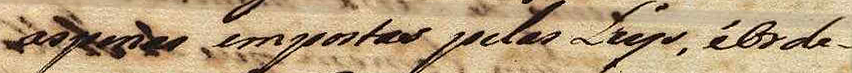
as penas empostas pelas Leys, e Orde
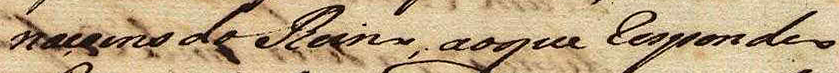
naçoens do Reino, ao que respondeo
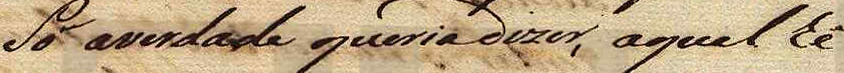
Só a verdade queria dizer, a qual hê
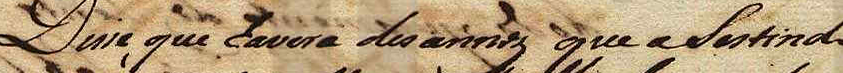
Disse, que havera des annoz que aSestindo
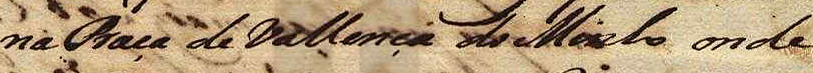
na Praça de Vallença do Minho onde
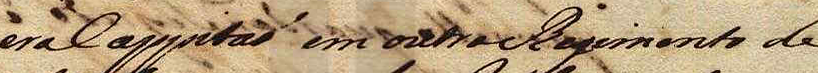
era Cappitaõ em outro Regimento de
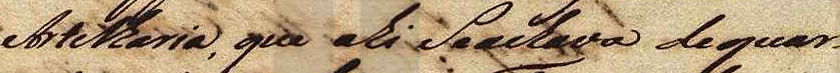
Artelharia, que ahi Se achava de quar
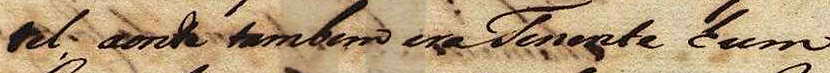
tel, aonde tambem era Tenente hum
